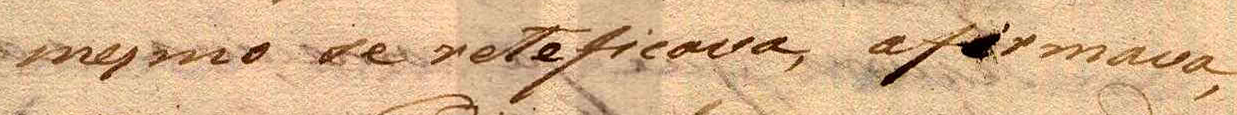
mesmo se reteficava, afirmava
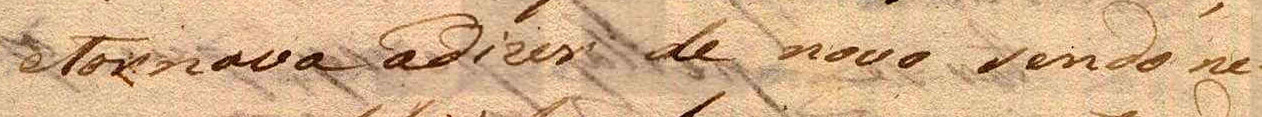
e tornava a dizer de novo sendo ne
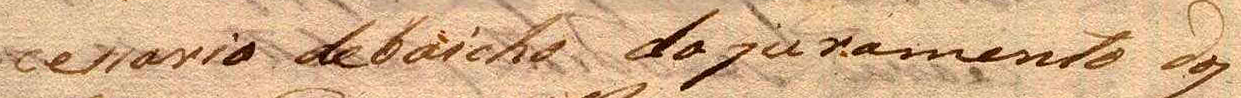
cessario debaicho do juramento dos
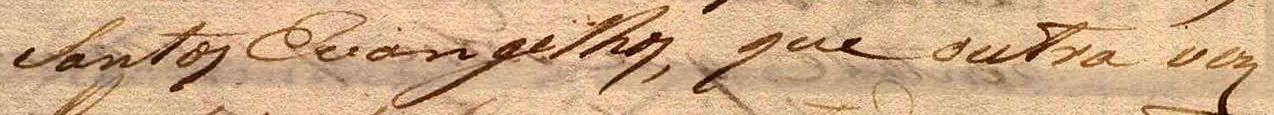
Santos Euangelhos, que outra vez
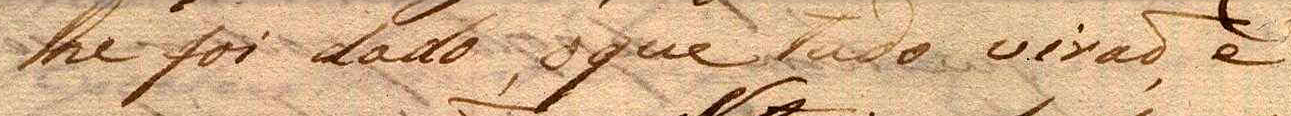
lhe foi dado, o que tudo viraõ, e
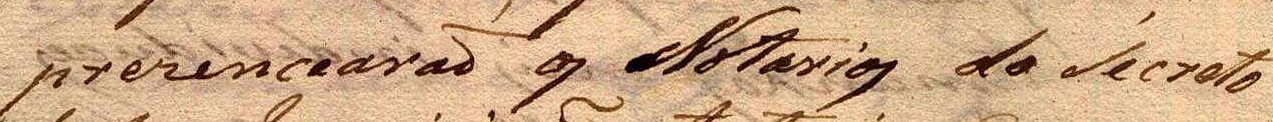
prezencearaõ os Notarios do secreto
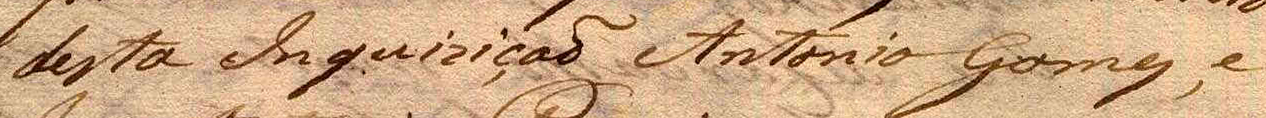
desta Inquiziçaõ Antonio Gomes, e
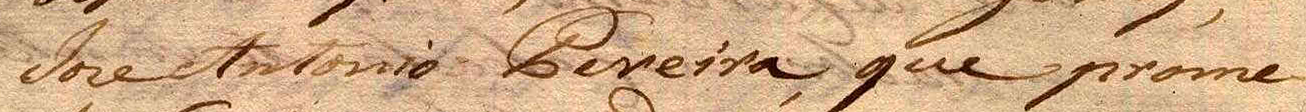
Ioze Antonio Pereira, que prome
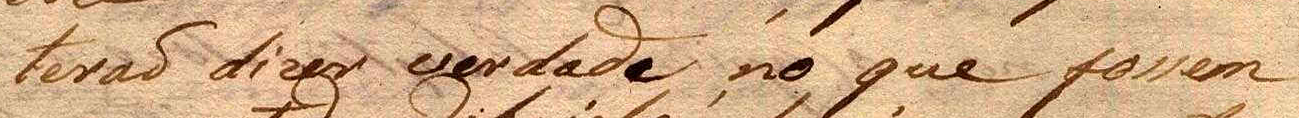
teraõ dizer verdade no que fossem
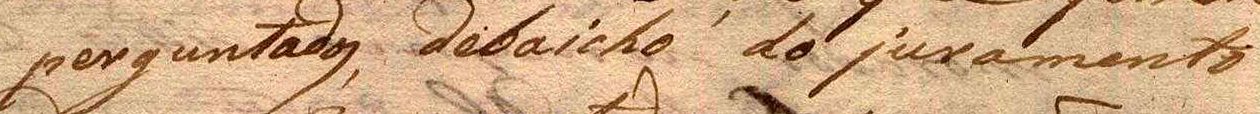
perguntados, debaicho do juramento
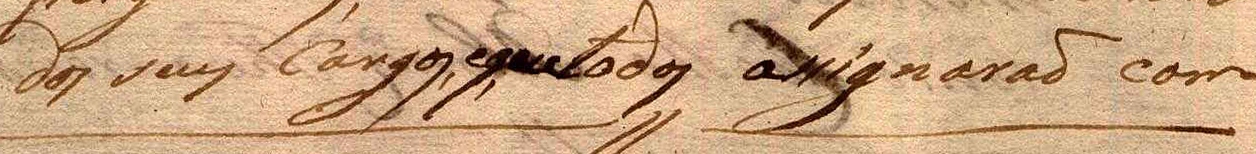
dos seus Cargos, e que todos assignaraõ com
